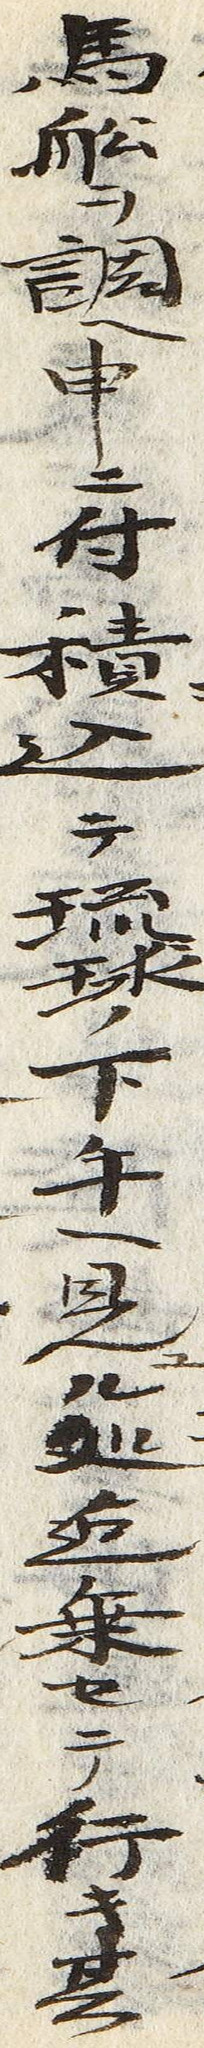馬船ヲ調ヘ申ニ付積込テ琉球ノ下手ヘミ見ユル処迄乗セテ行キ其
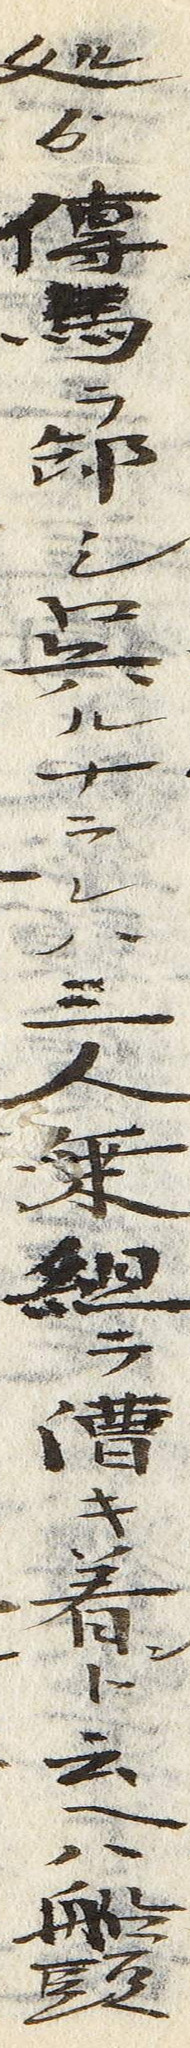処ゟ伝馬町ヲ卸シ呉ルナラレハ三人乗組テ漕キ着ント云ヘハ船頭
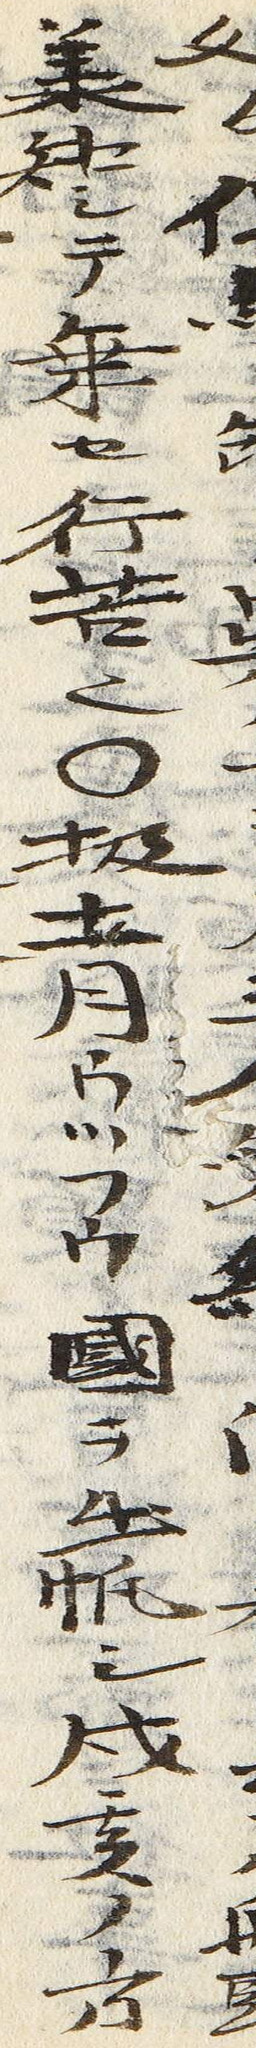承知シテ乗セ行苦也〇扨十一月ウツフウ国ヲ出航シ戌亥ノ方
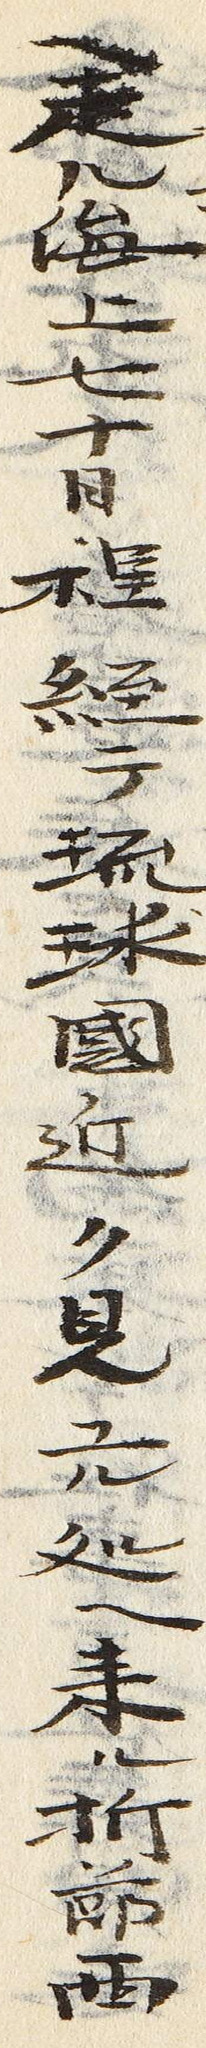ヘ走ル海上七十日程経テ琉球国近ク見ユル処ヘ来ル折節西
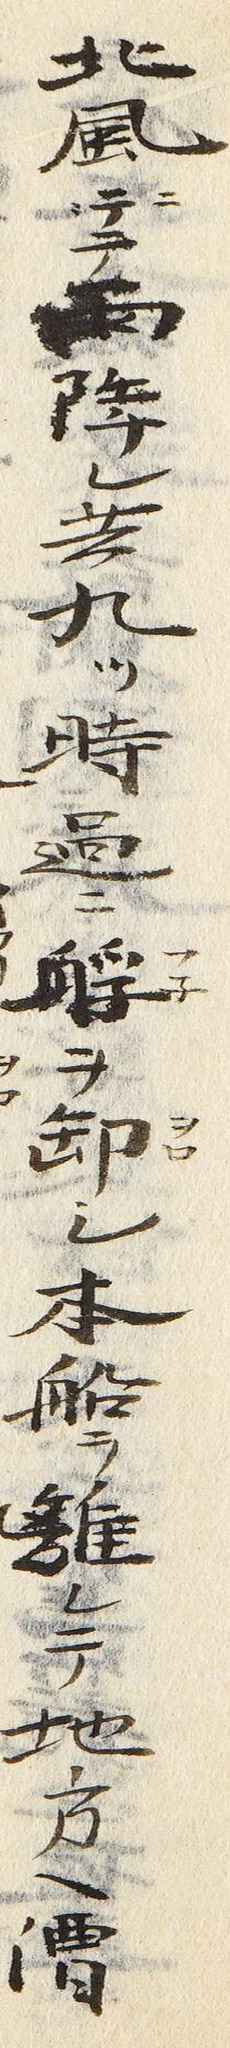北風ニテ雨降レ共九ツ時過ニ艀ヲ卸シ本船ヲ離レテ地方へ漕
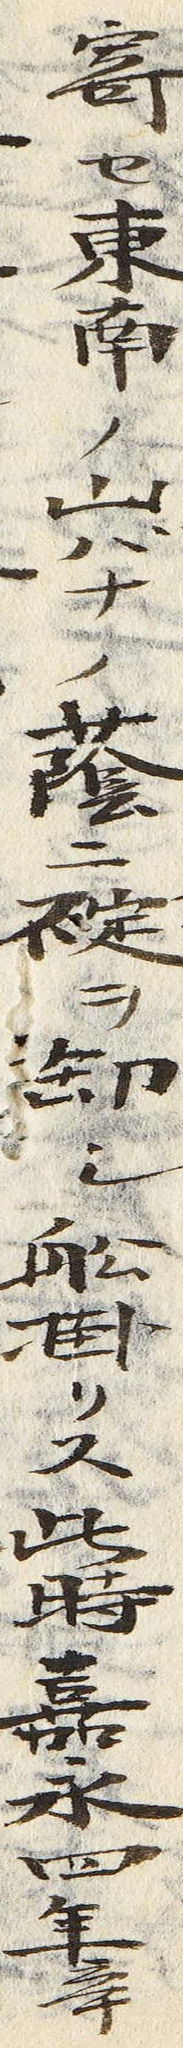寄セ東南ノ山バナノ蔭ニ碇ヲ卸シ船掛リス此時嘉永四年辛
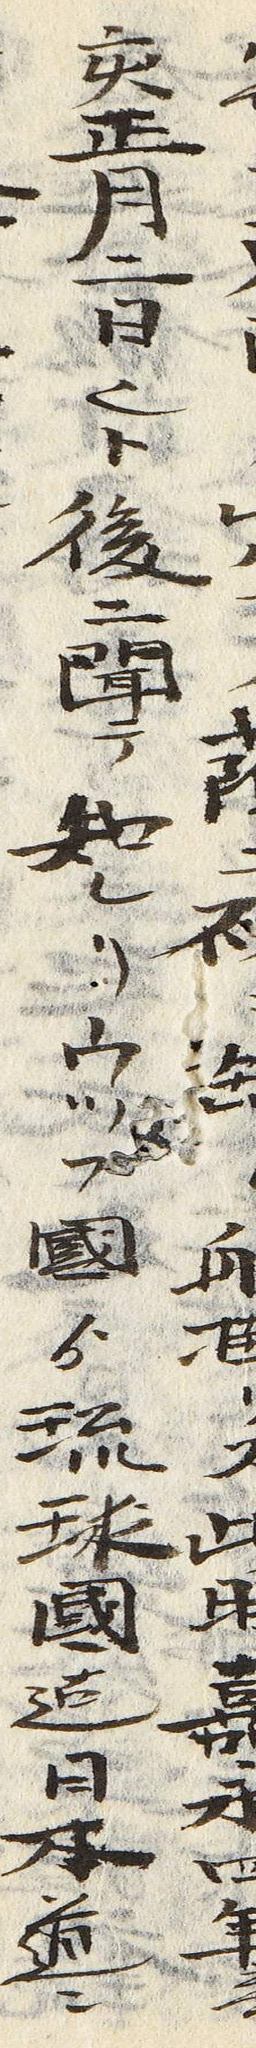亥正月二日也ト後ニ聞テ知レリウツフ国ゟ琉球国迄日本道ニ
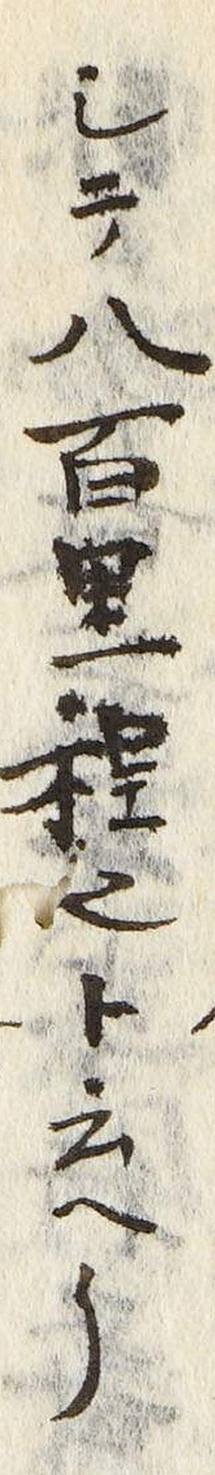シテ八百里程也ト云ヘリ
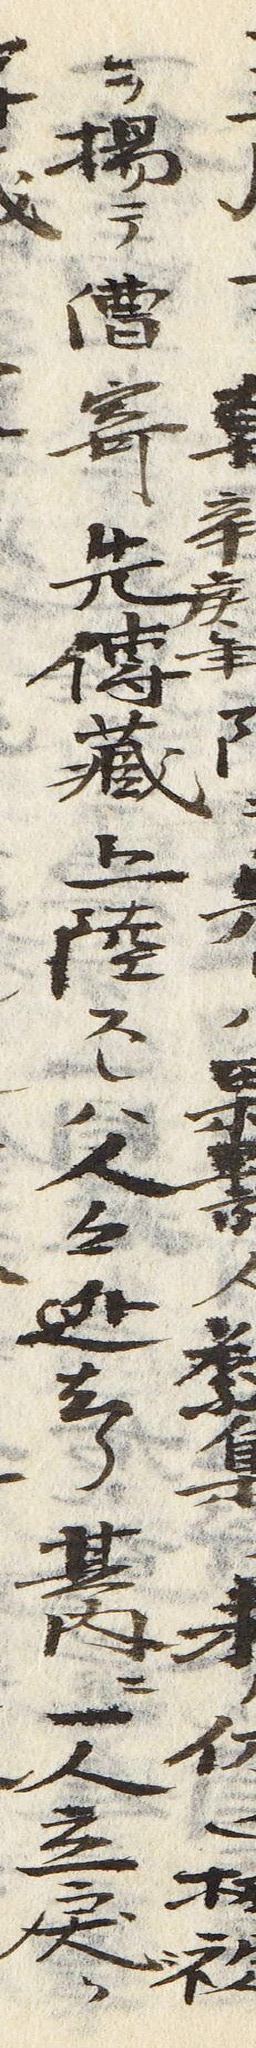ヲ揚テ漕寄先傳蔵上陸スレハ人々逃去リ其内ニ一人立戻リ
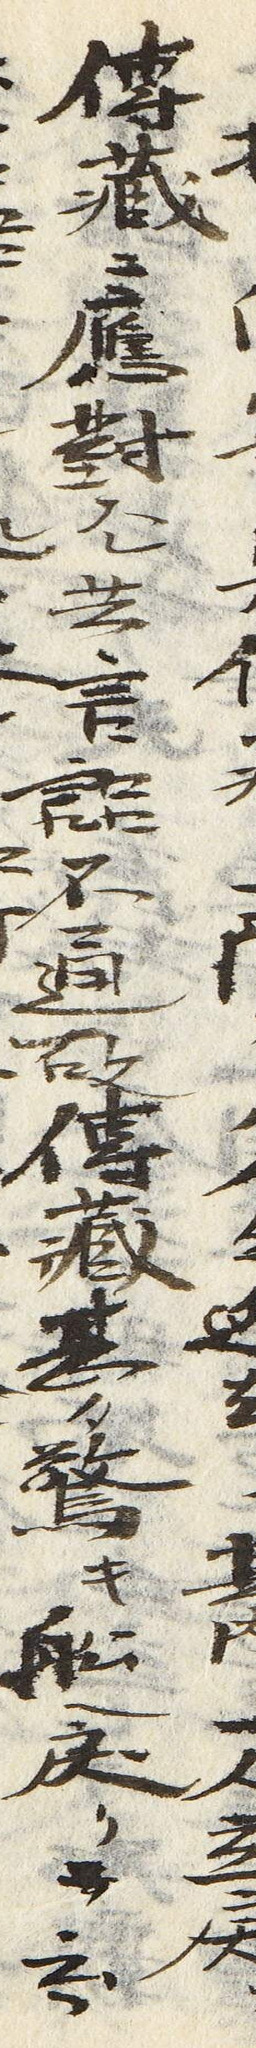傳蔵ニ応対スレ共言葉不通故傳蔵甚タ驚キ船ヘ戻リ
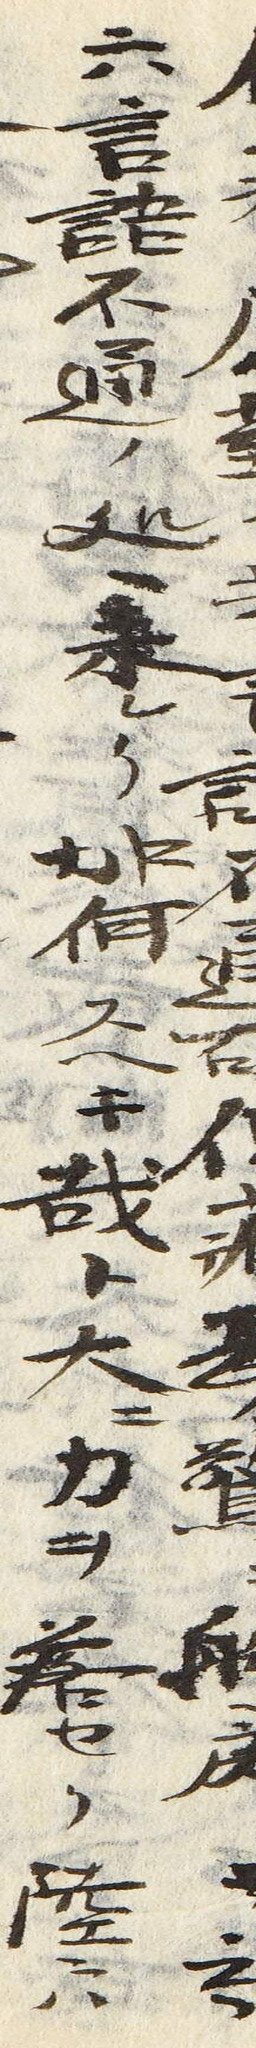六言語不通ノ処ヘ来レリ如何スヘキ哉ト大ニ力ヲ落セリ陸ニハ
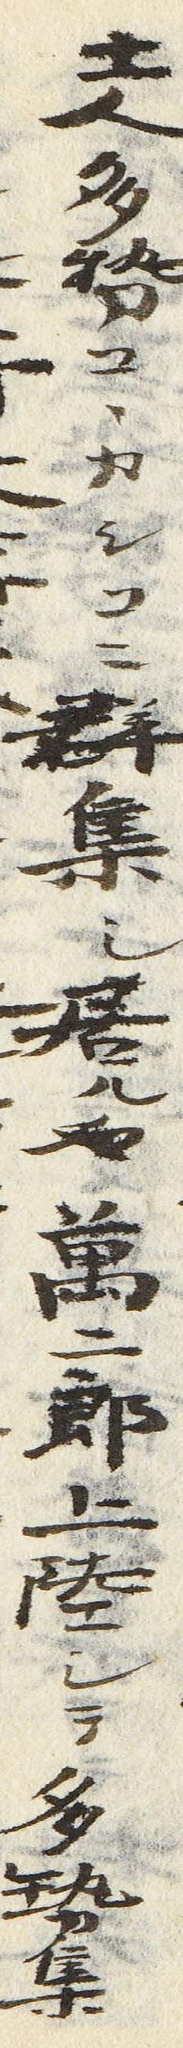土人多勢コヽカシコニ群集シ居ル也萬二郎上陸シテ多勢集
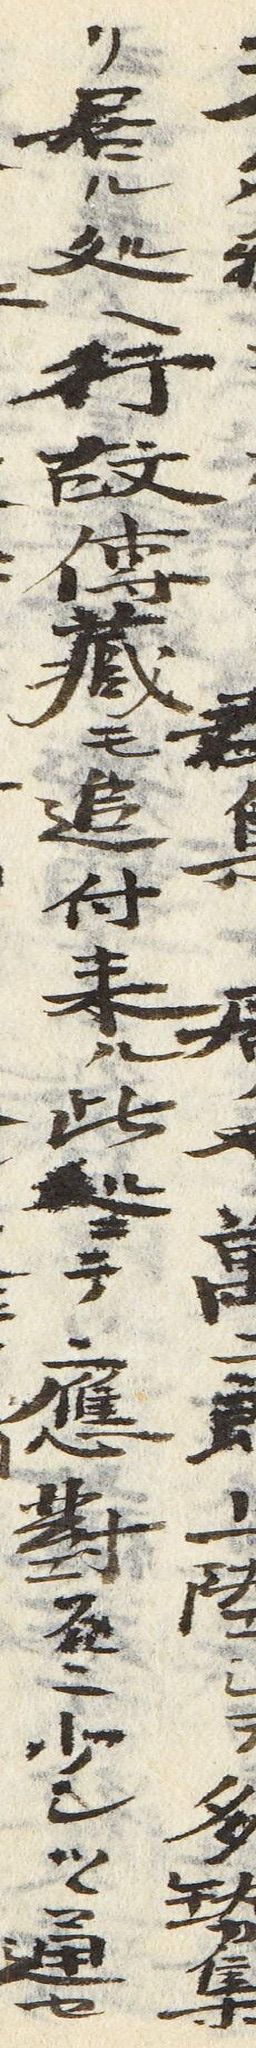リ居ル処ヘ行故傳蔵モ追付来ル此処ニテ応対スルニ少シツヽ通セ
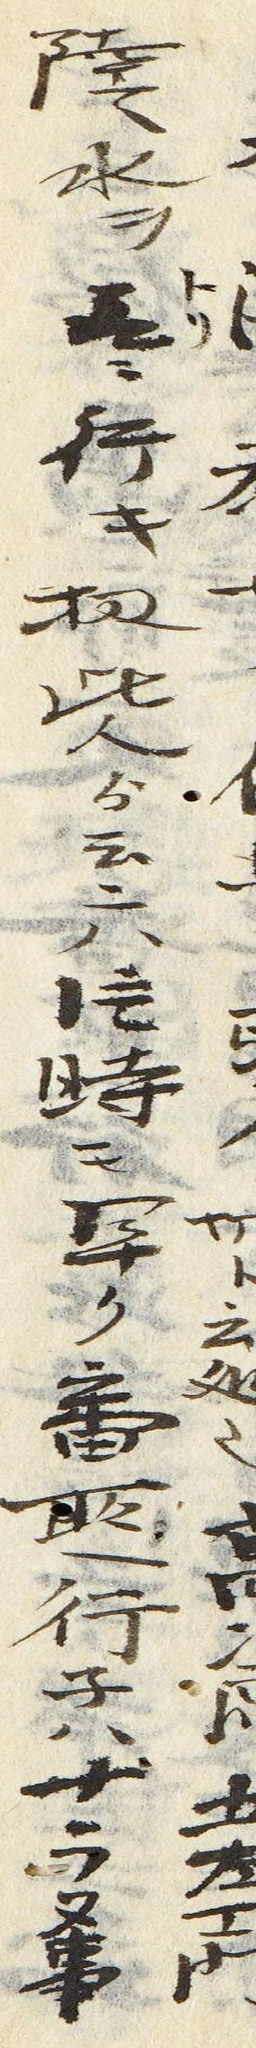陸水ヲ取ニ行キ扨此人ゟ云ニハ片時モ早ク番所ヘ行ネハナラヌ事

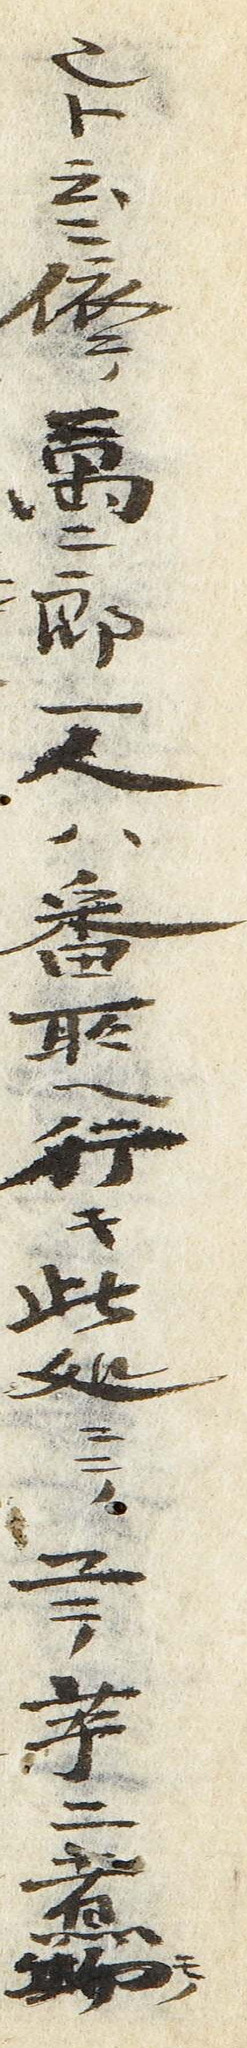也ト云ニ依テ萬二郎一人ハ番所へ行キ此処ニテユテ芋ニ煮物
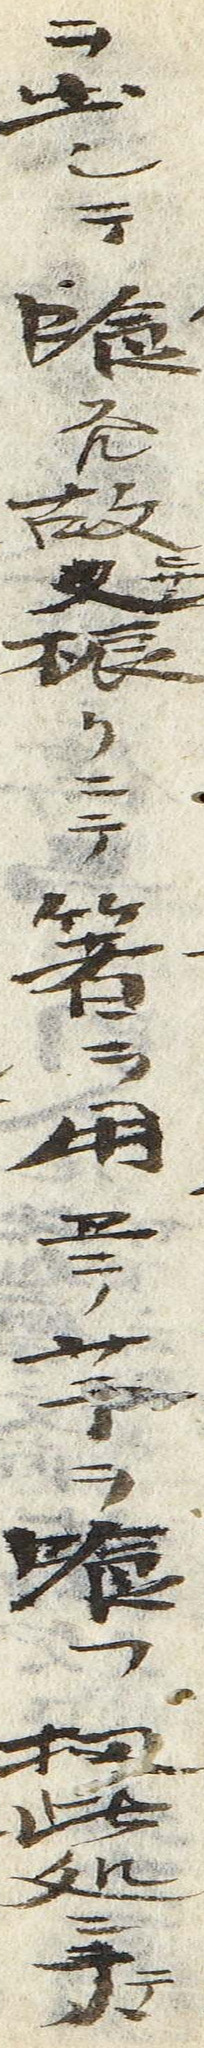ヲ出シテ喰スル故久振リニテ箸ヲ用エテ芋ヲ喰フ扨此処ニテ
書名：漂流記聞
